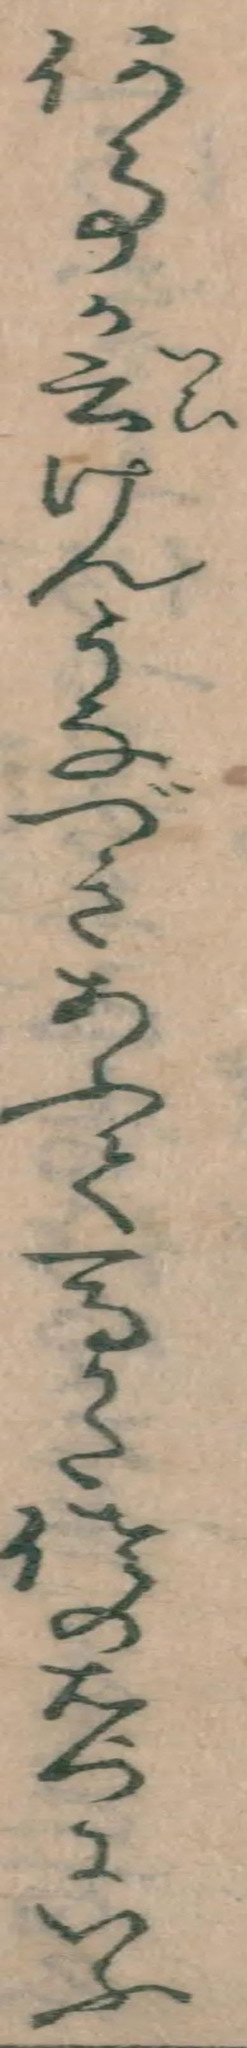何事か云けんうなづきあふて馬かた佐の右衛門にいふ
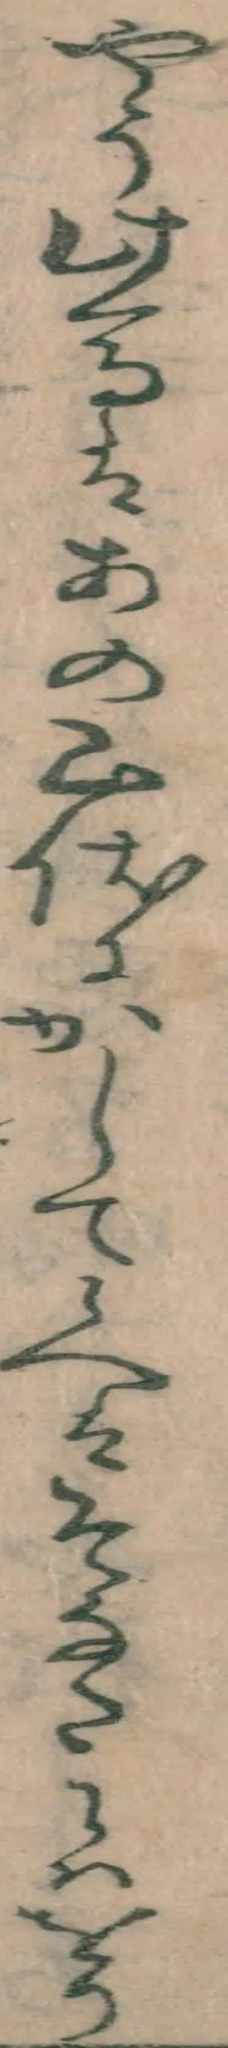やう此馬はあの山伏にかして候へはそなたにはをり
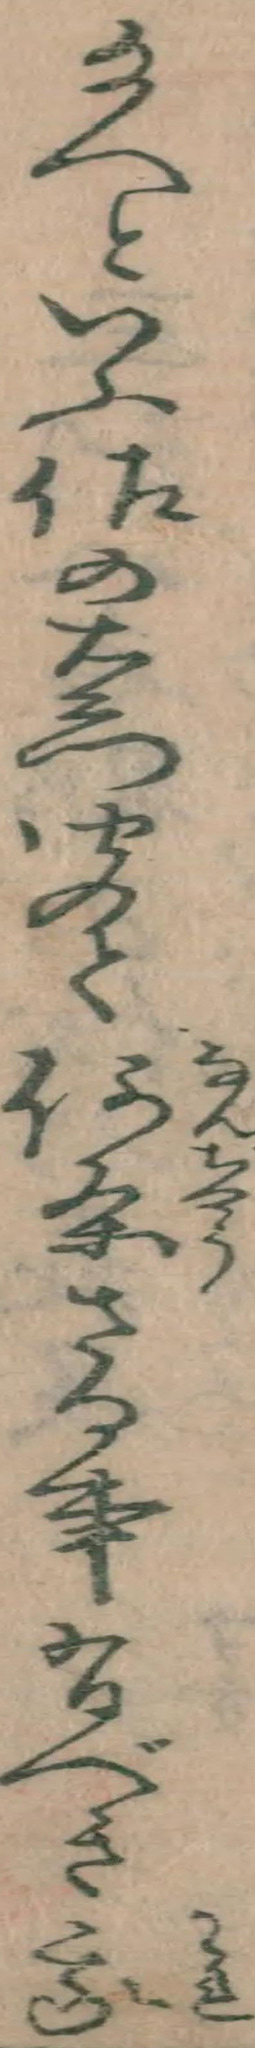給へといふ佐の右衛門聞て何条さる事有べき我
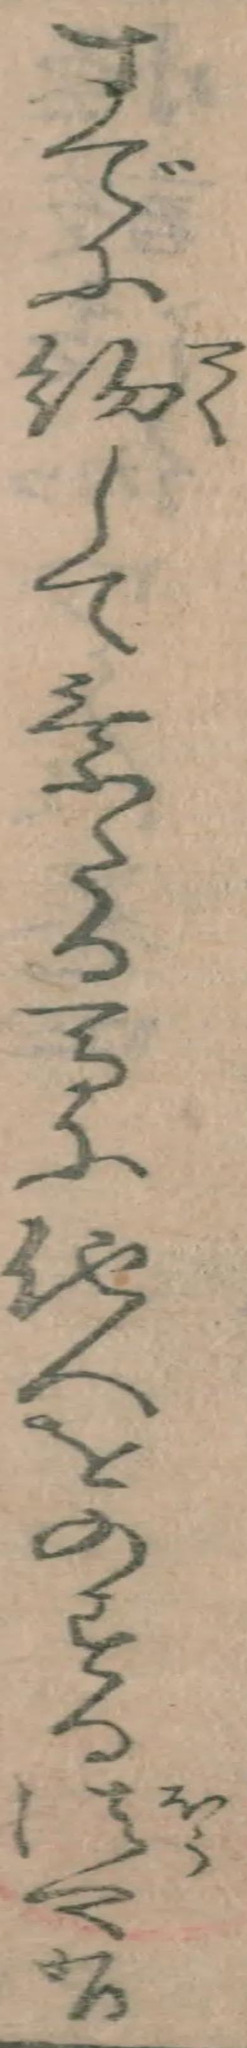すでに約して乗たる馬に他人をのする法や有
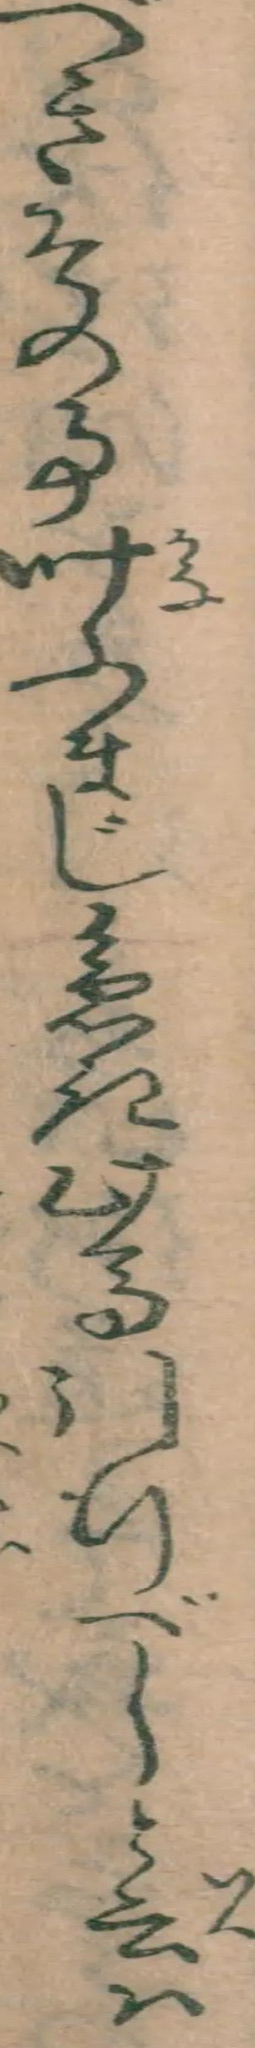べきその事叶ふまじ急き此馬引行べしと云は
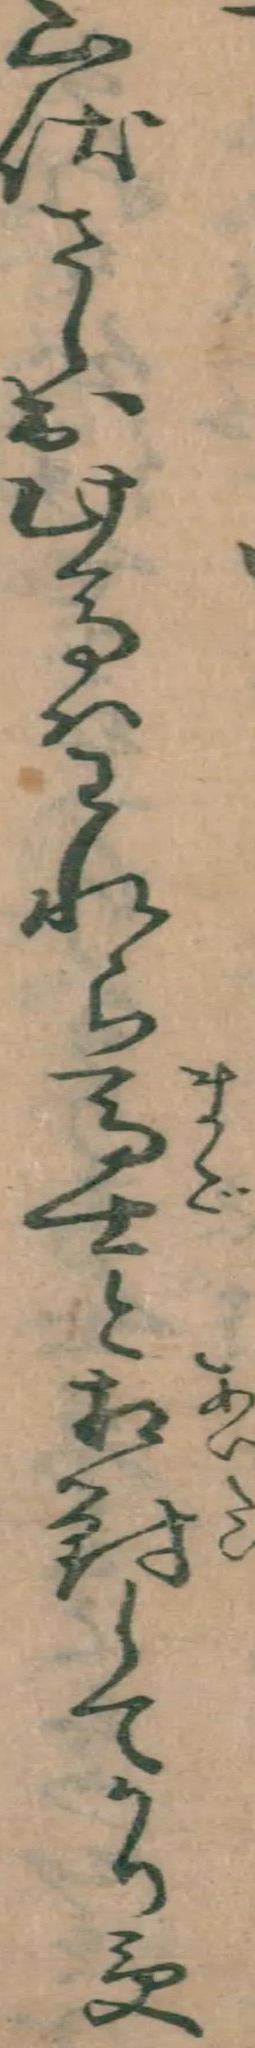山伏さし出此馬はわれら馬士と相対してかり受
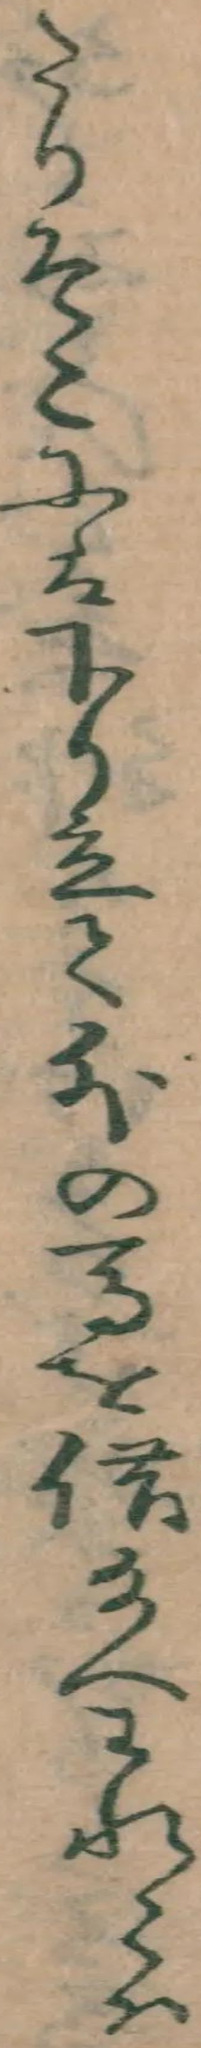たりそこには下り立て外の馬を借給へわれらは
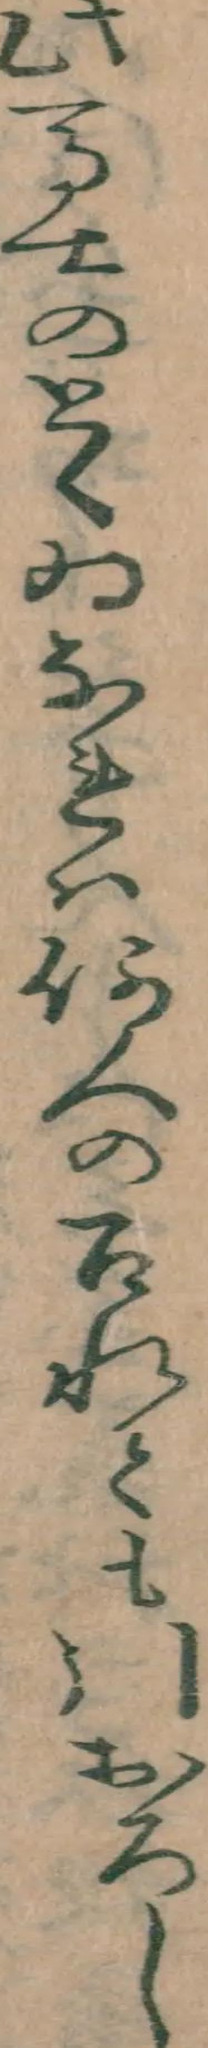此馬士のとくゐなれは何人の召れとも引おろし
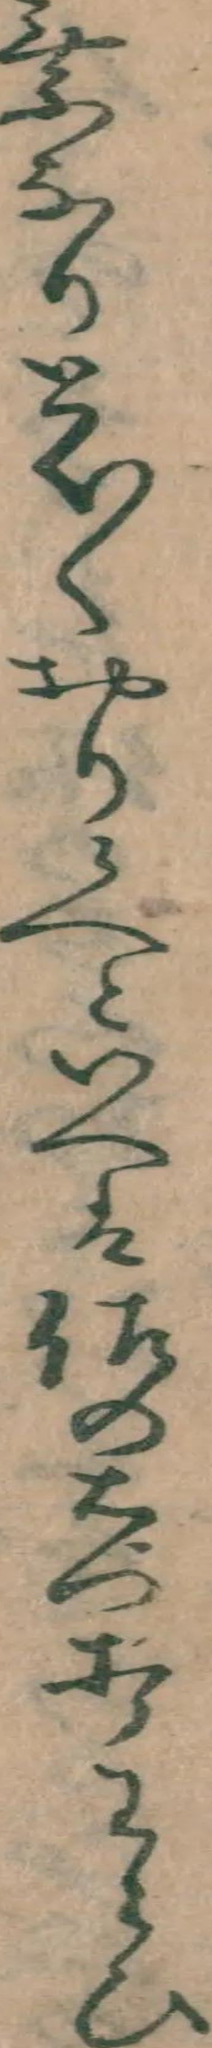乗なりとく〳〵おり候へといへは佐の右衛門打わらひ
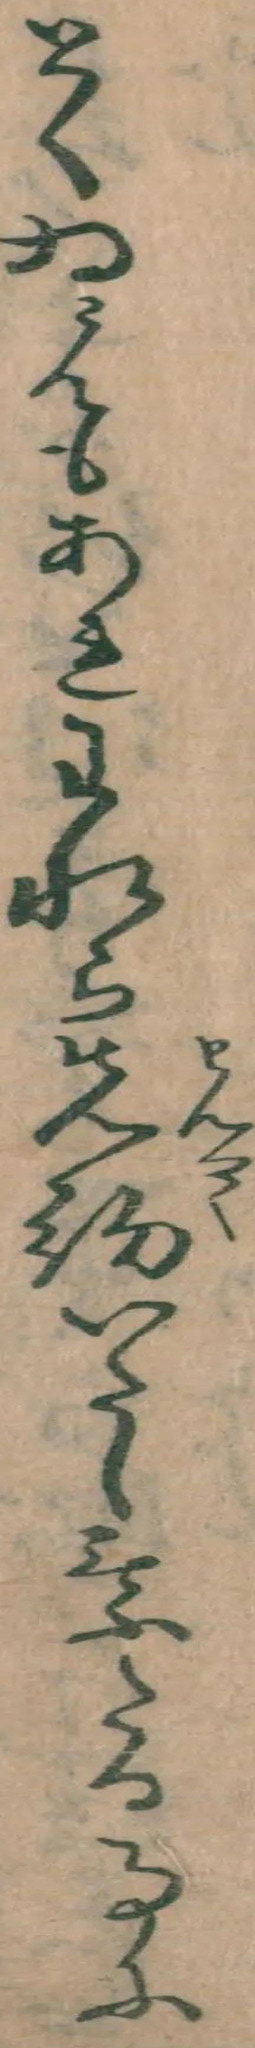とくゐにてもあれわれら先約いたし乗たる馬に
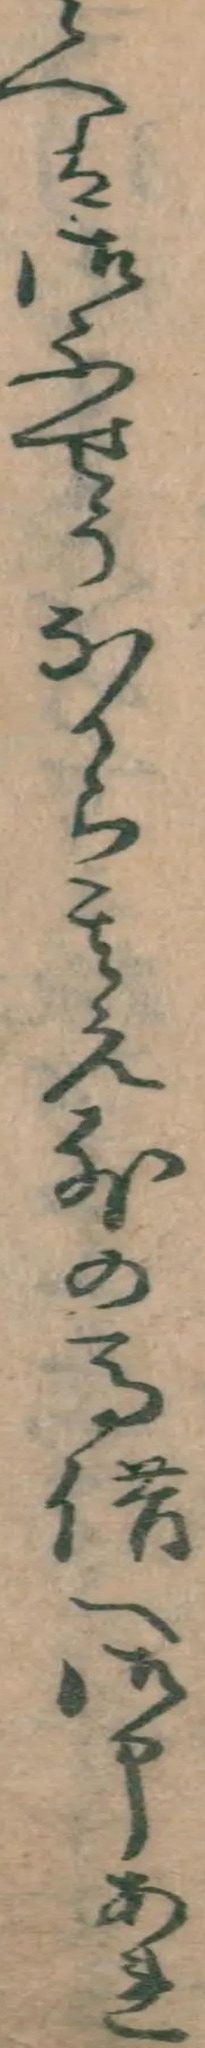候へは御ふせうなから其元外の馬借へ御申あれ
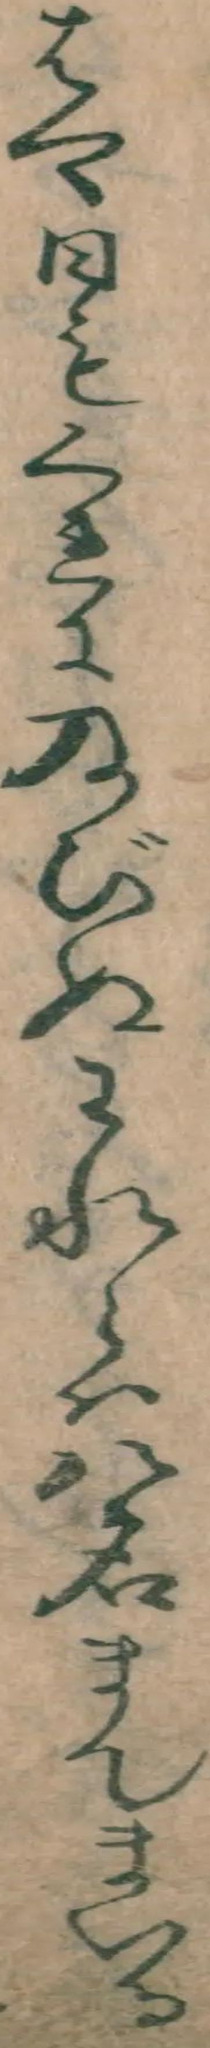はや日もくれに及びぬわれらは八名まてまいる
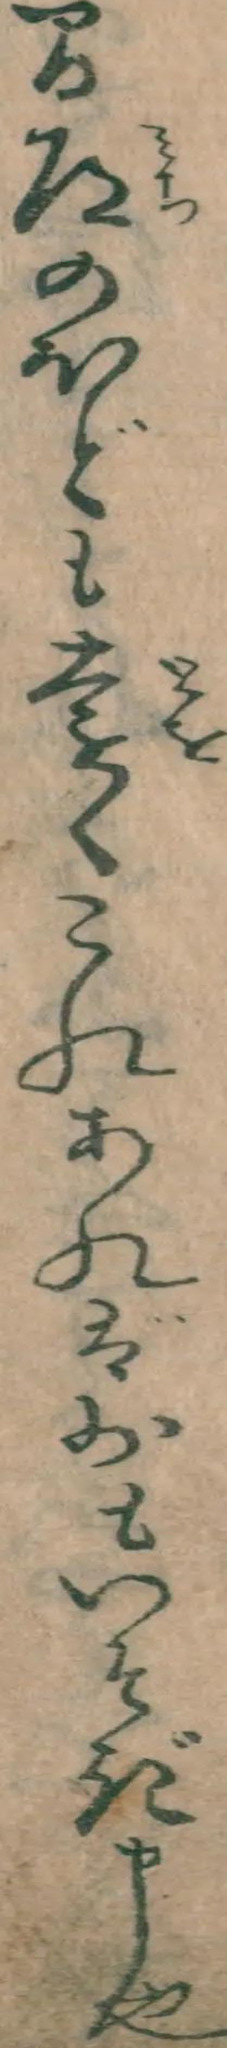間道のほども遠くこれあれば少もいそぎ申也
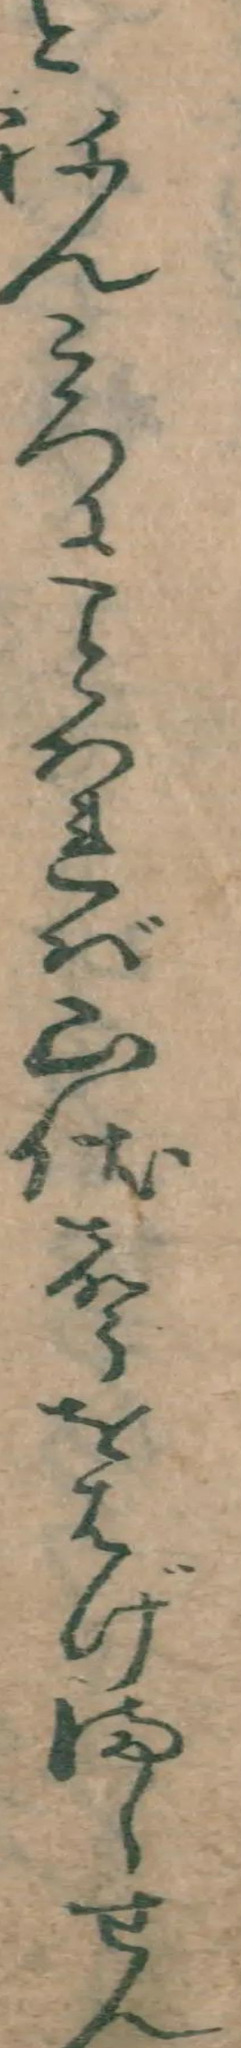とねんころにことはれば山伏声をはげましせん

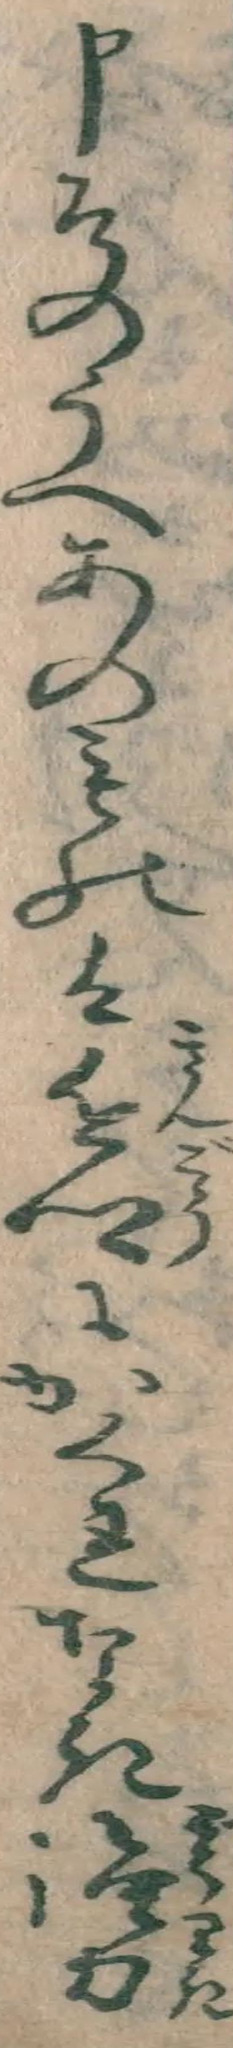申そのうへあのものは近郷にかくれなき強力
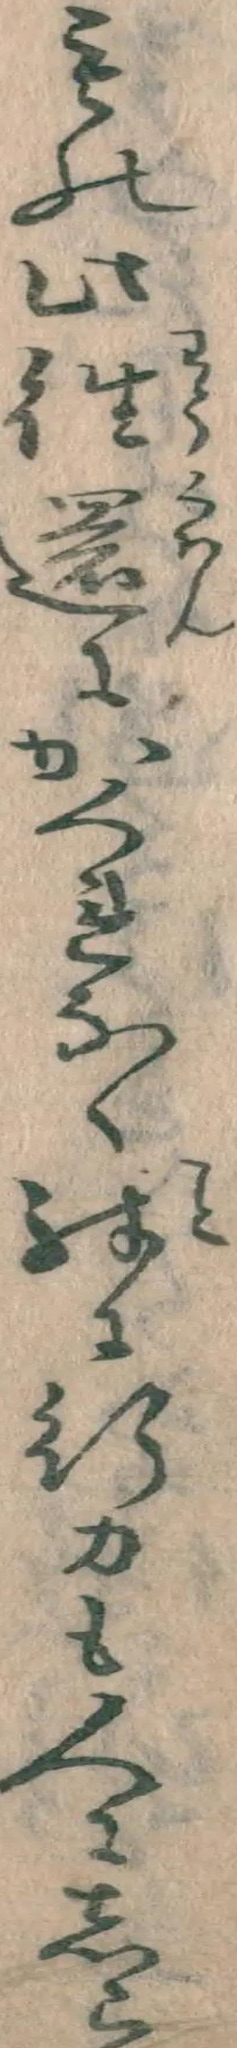もの此往還にかくれなく殊に行力も人々しら
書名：怪談御伽童 5巻. [2]
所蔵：国立国会図書館 National Diet Library, JAPAN
